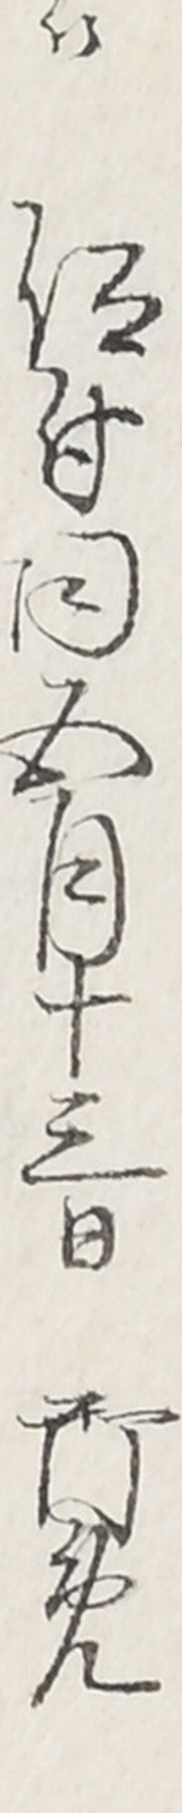被仰付同五月十三日御免
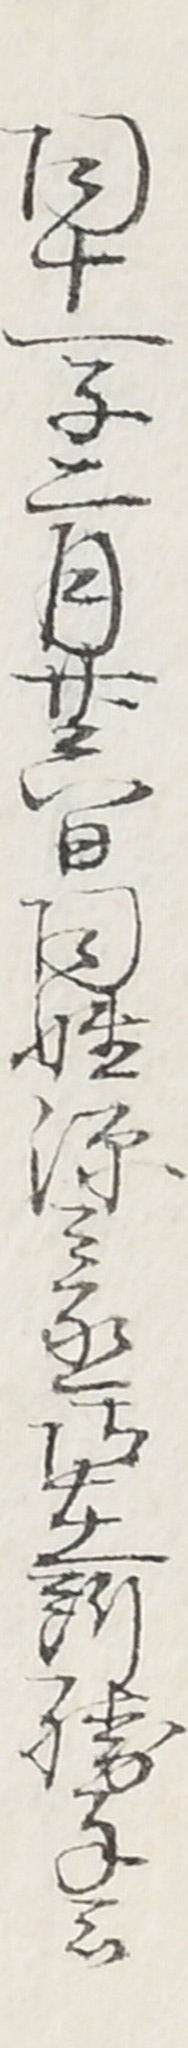一同十一子二月廿六日同姓源之丞御在所勝手被
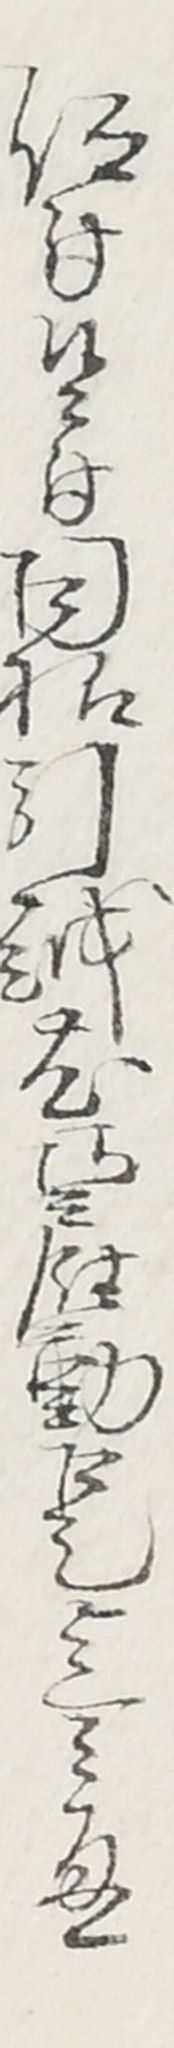仰付候ニ付同様引越尤御雇勤是迄之通
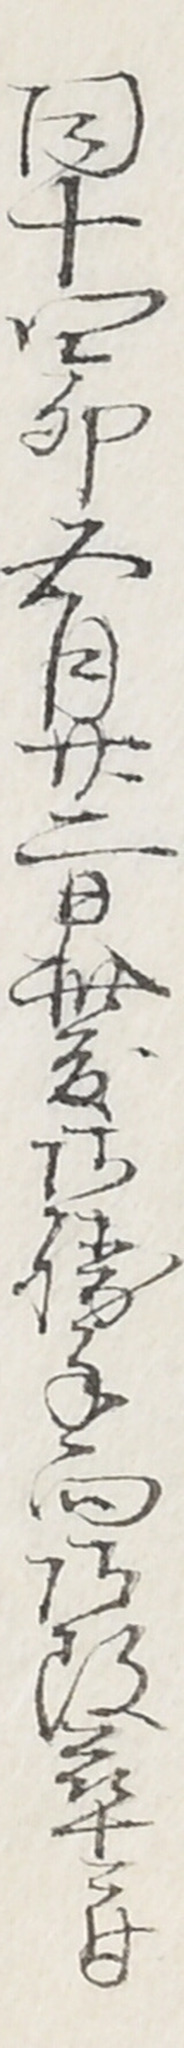一同十四卯五月廿二日此度御勝手向御改革ニ付
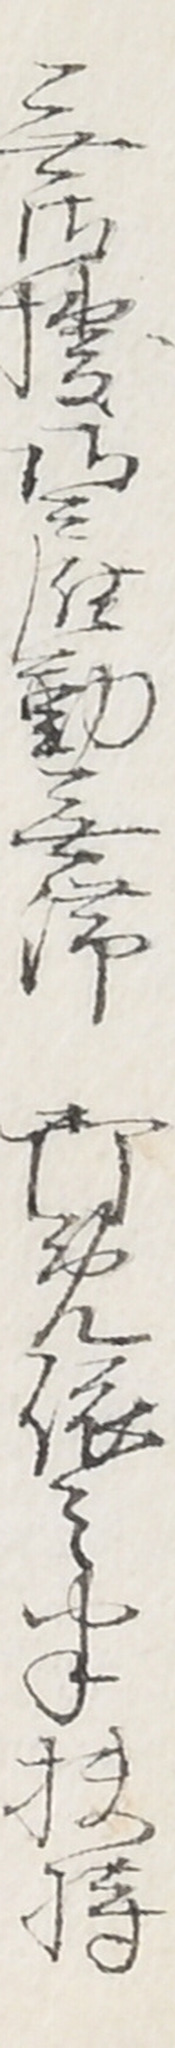無御拠御雇勤無滞御免依之半扶持
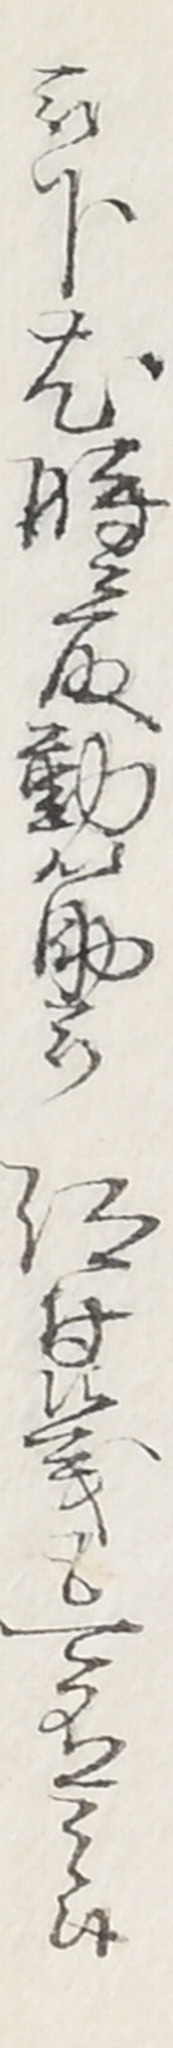被下尤時ニ取勤筋被仰付候義も可有之候
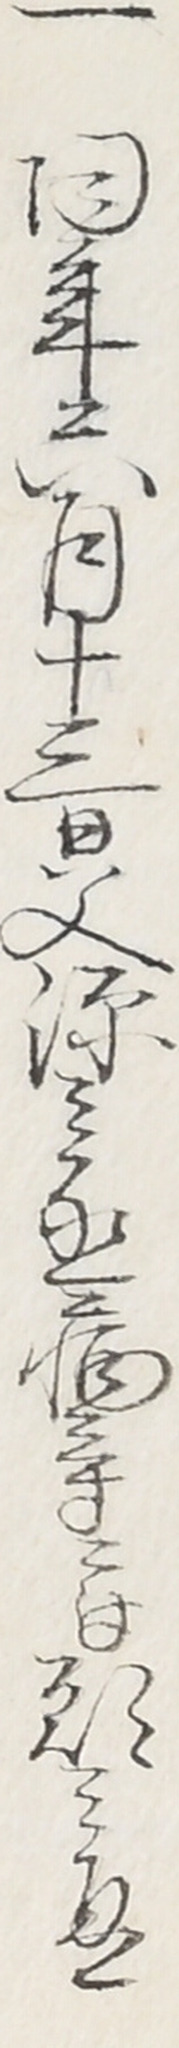一同年六月十三日父源之丞病気ニ付願之通
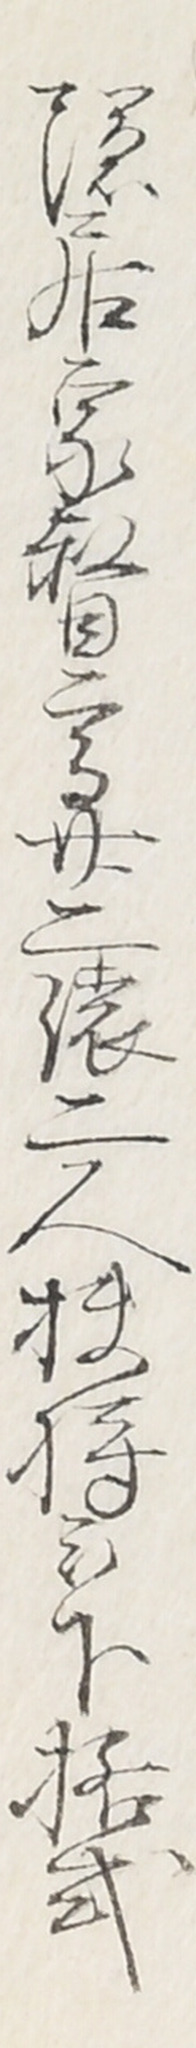隠居家督高廿二俵二人扶持被下格式
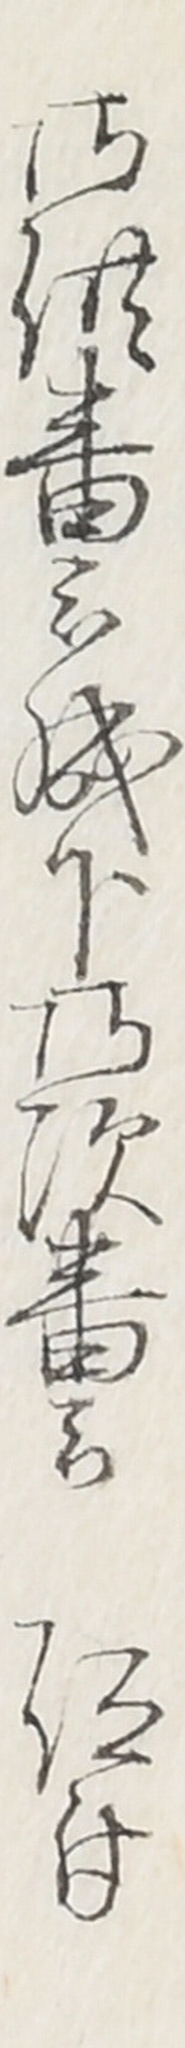御供番被成下御次番被仰付

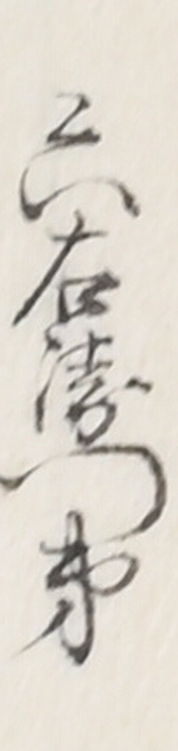六右衛門弟
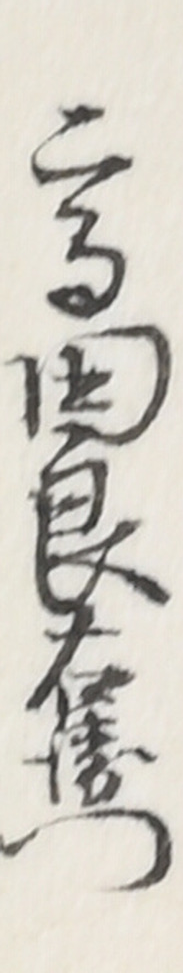高田良右衛門
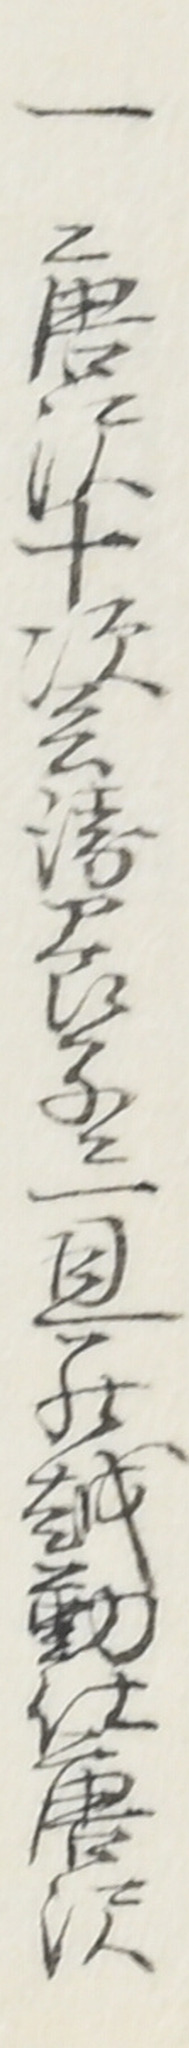一唐沢十次兵衛養子ニ一旦罷越勤仕唐沢
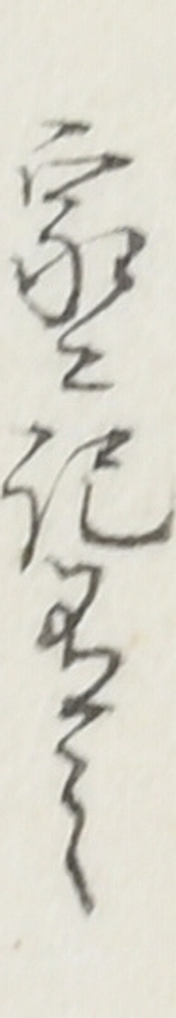家ニ記有之
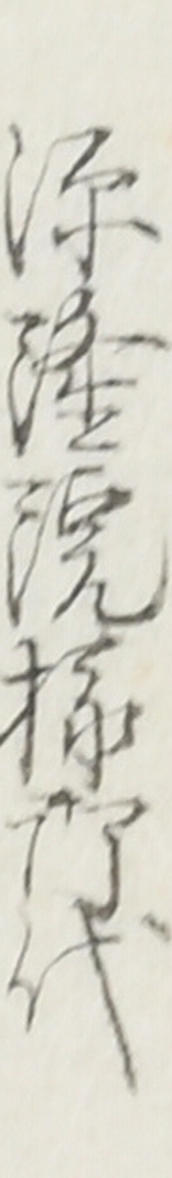源隆院様御代
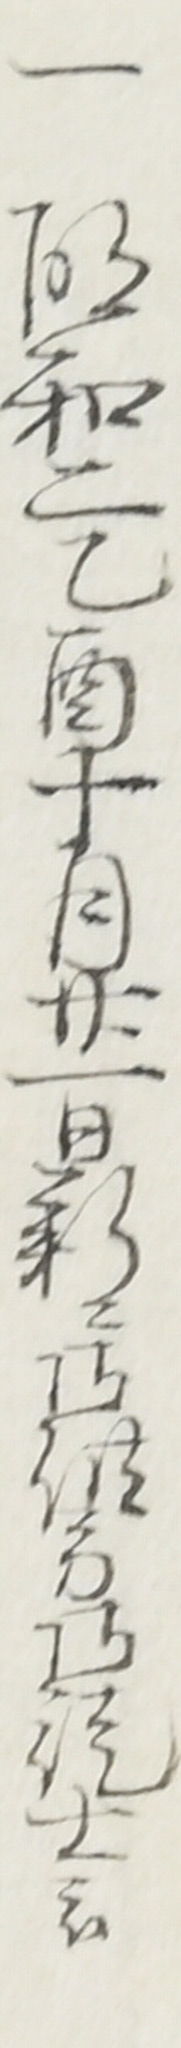一明和二乙酉十月廿一日新ニ御供方御徒士被
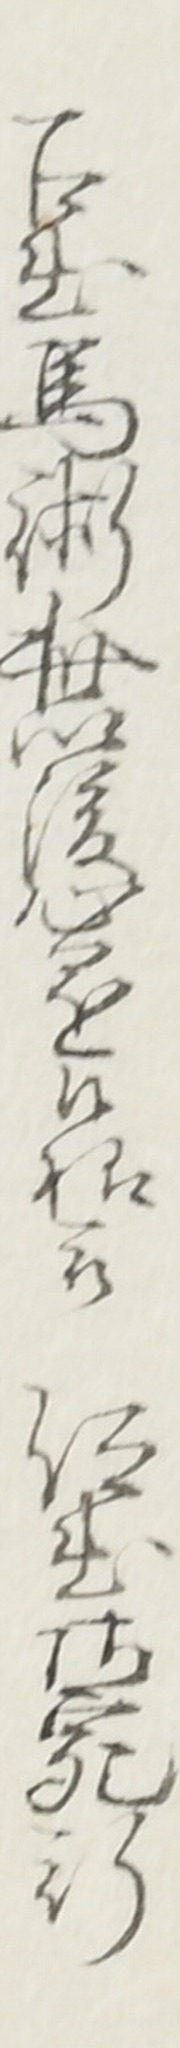召出馬術此以後心懸候様被仰出御宛行
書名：無足諸士勤仕録（四）
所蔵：伊那市立高遠町図書館・合同会社AMANE
